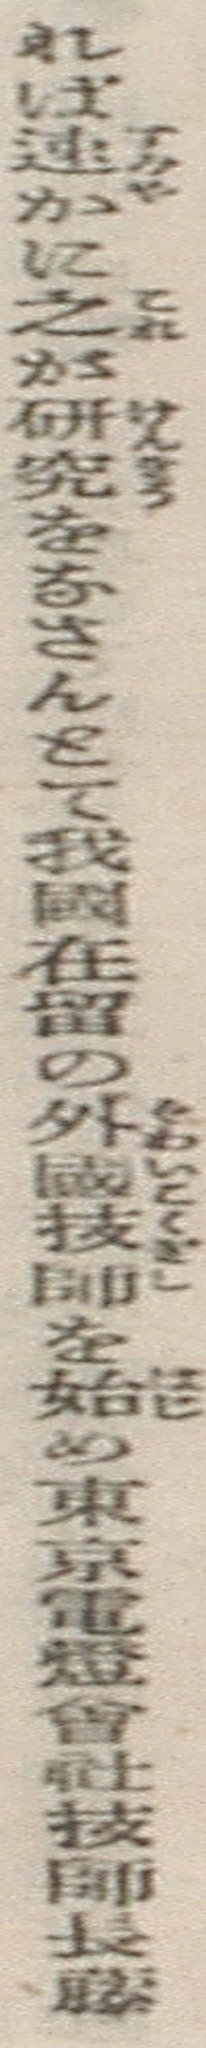れば速かに之が研究をなさんとて我國在留の外國技師を始め東京電燈會社技師長藤
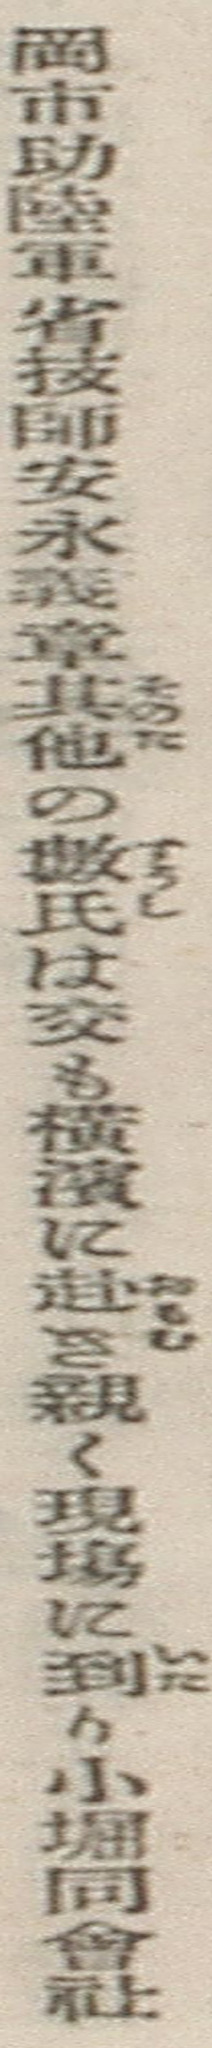岡市助陸軍省技師安永義章其他の数氏は交も横浜に赴き親く現場に到り小堀同會社
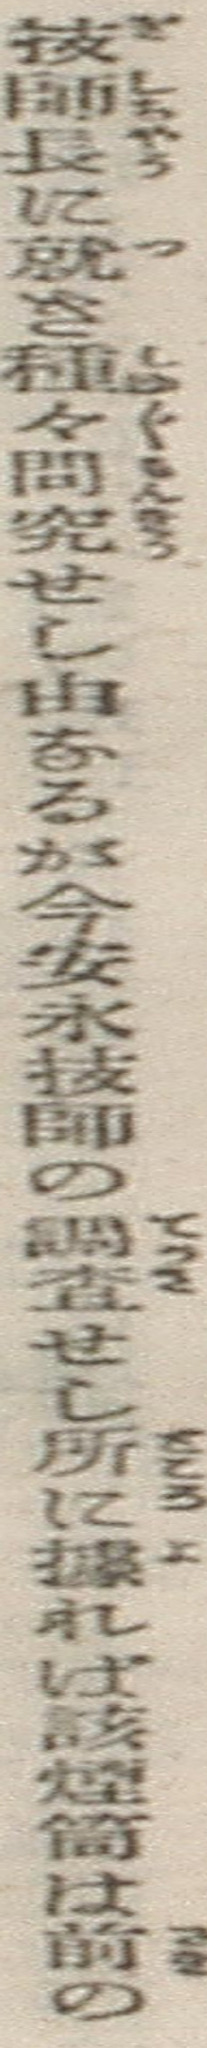技師長に就き種々問究せし由なるが今安永技師の調査せし所に據れば該煙筒は前の
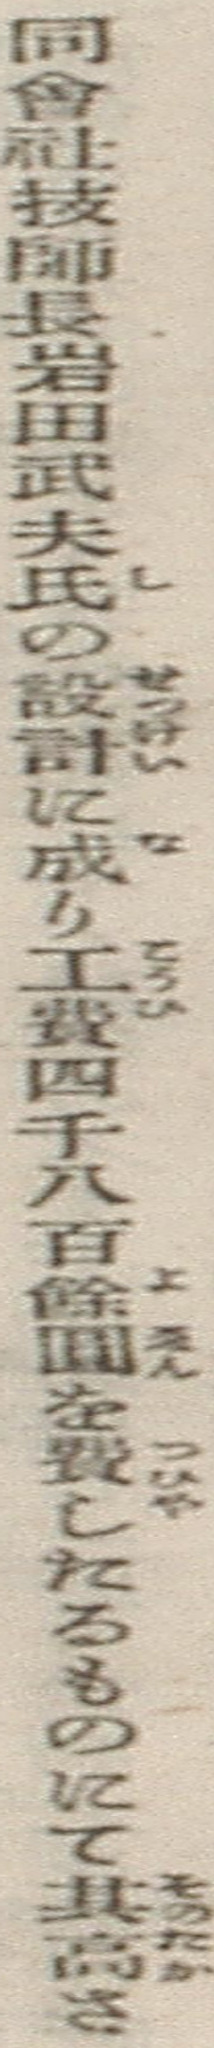同會社技師長岩田武夫氏の設計に成り工費四千八百餘圓を費したるものにて其高さ
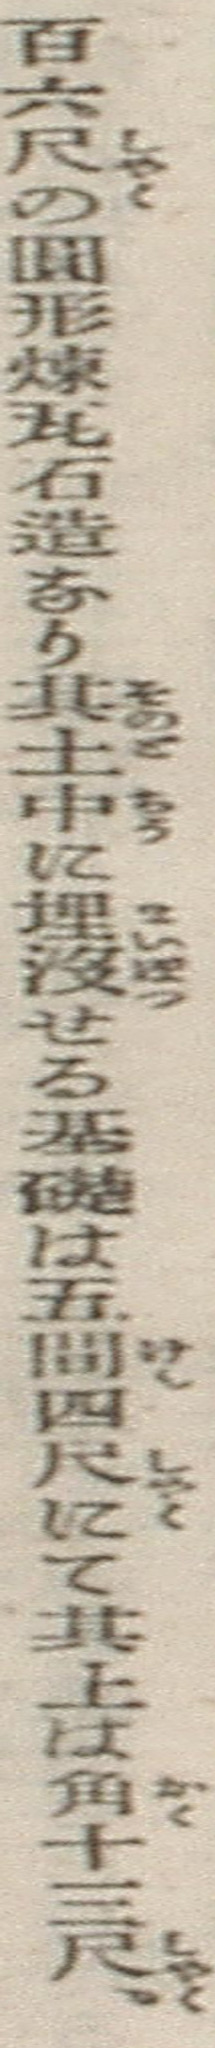百六尺の圓形煉瓦石造なり其土中に埋没せる基礎は五間四尺にて其上は角十三尺、
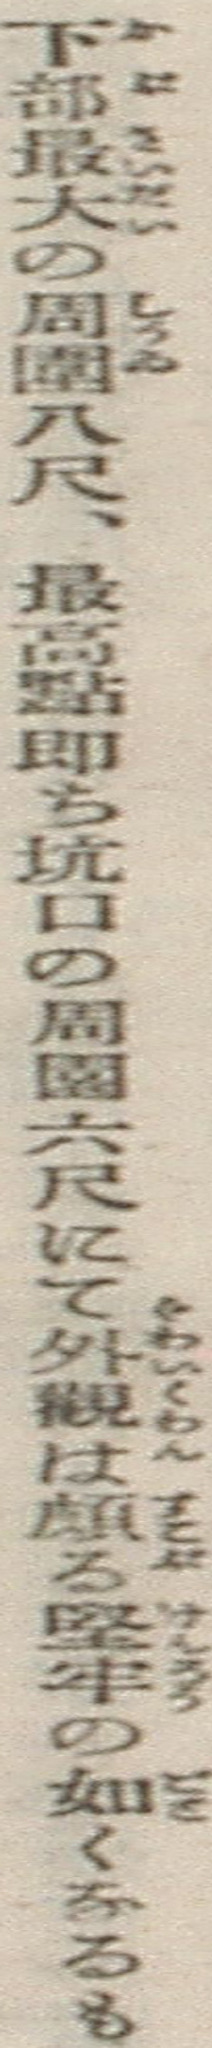下部最大の周囲八尺、最高点即ち抗口の周囲六尺にて外観は頗る堅牢の如くなるも
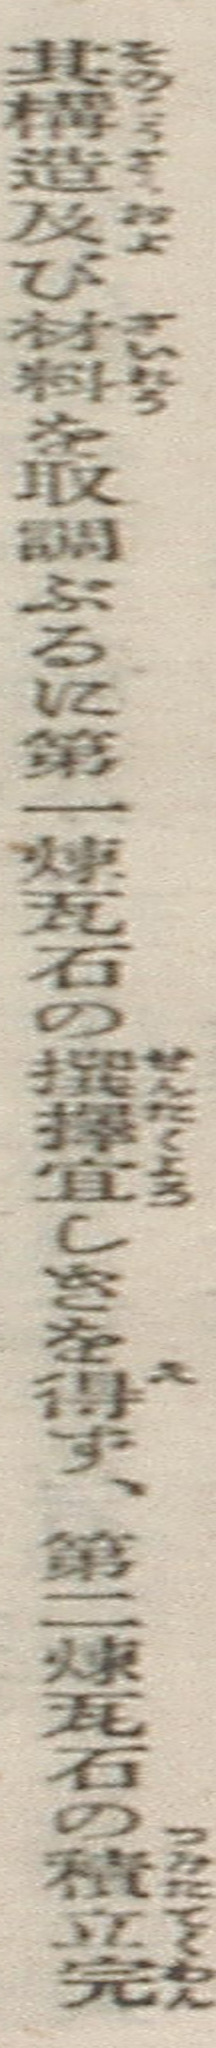其構造及び材料を取調ぶるに第一煉瓦石の選擇宜しきを得ず、第二煉瓦石の積立完
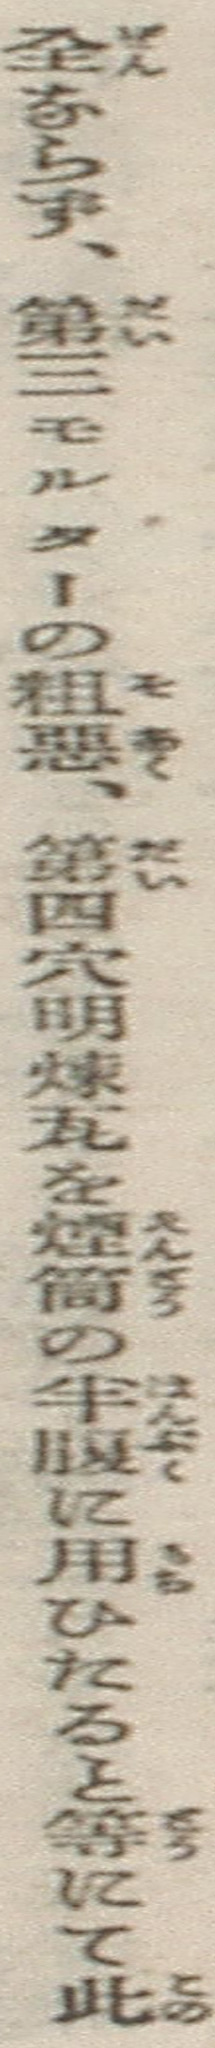全ならず、第三モルターの粗悪、第四穴明煉瓦を煙筒の半腹に用ひたること等にて此
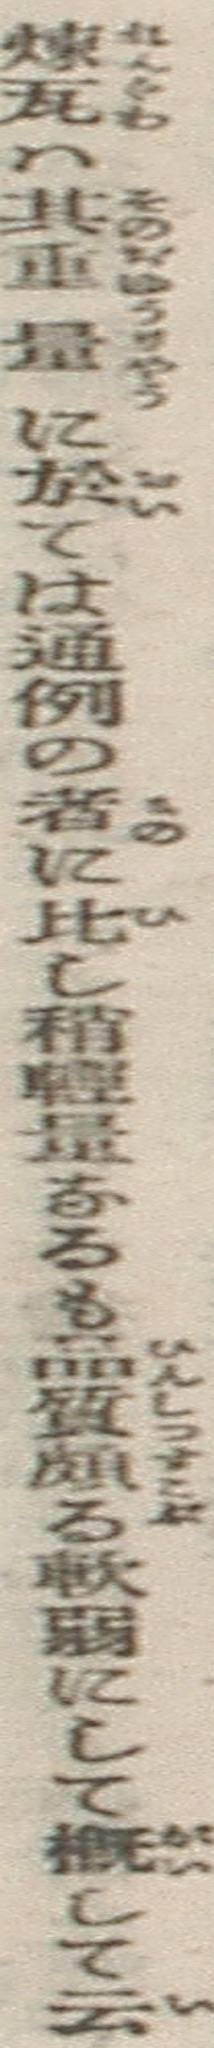煉瓦ハ其重量に於ては通例の者に比し稍軽量なるも品質頗る軟弱にして概して云

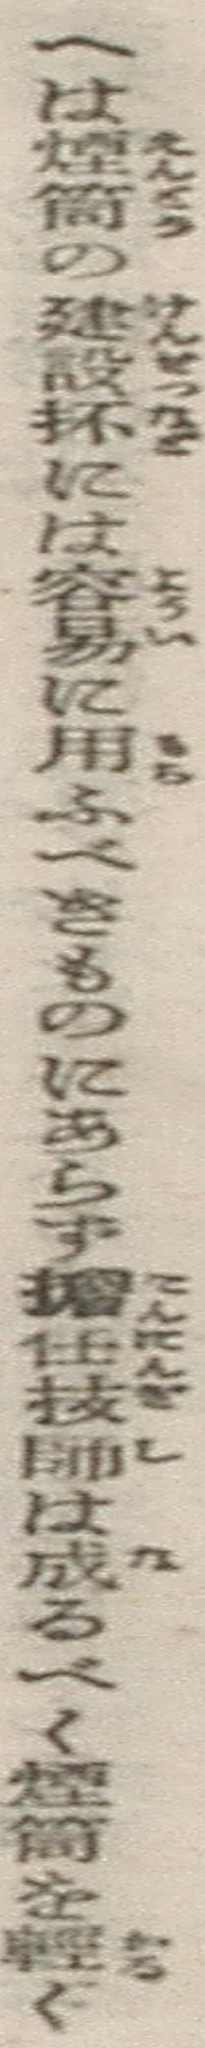へは煙筒の建設抔には容易に用ふべきものにあらず澹任技師は成るべく煙筒を輕く
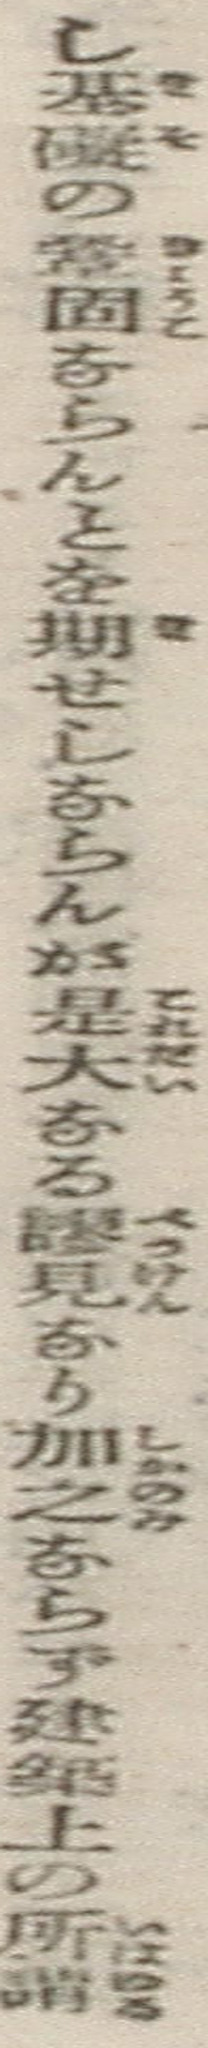し基礎の鞏固ならんことを期せしならんが是大なる謬見なり加之ならず建築上の所謂
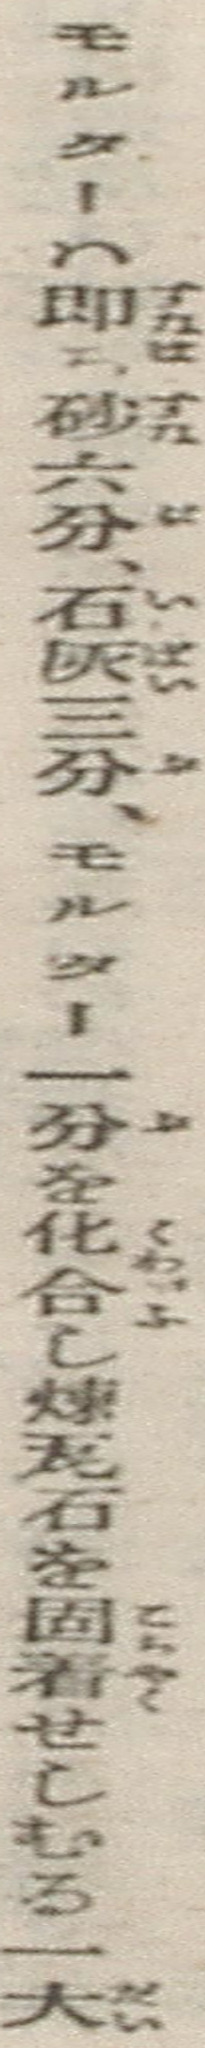モルターハ即ち砂六分、石灰三分、モルタ―一分を化合し煉瓦石を固着せしむる一大
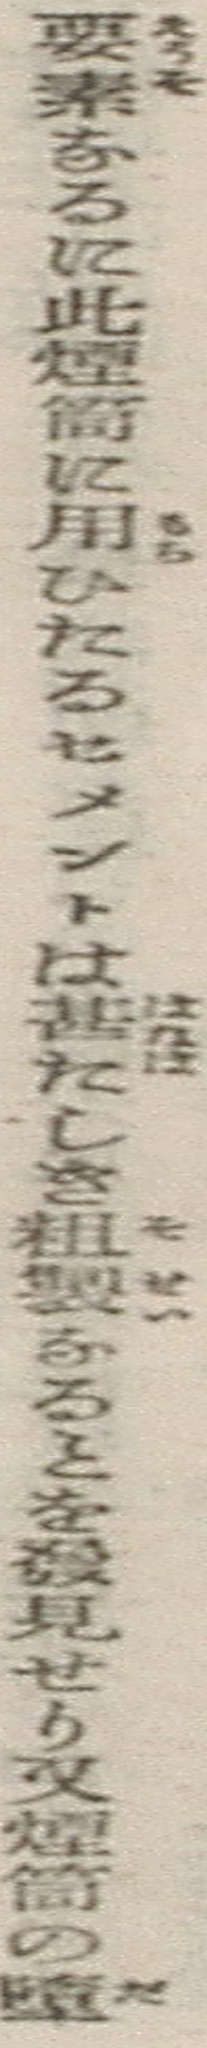要素なるに此煙筒に用ひたるセメントは甚たしき粗製なることを発見せり又煙筒の堕
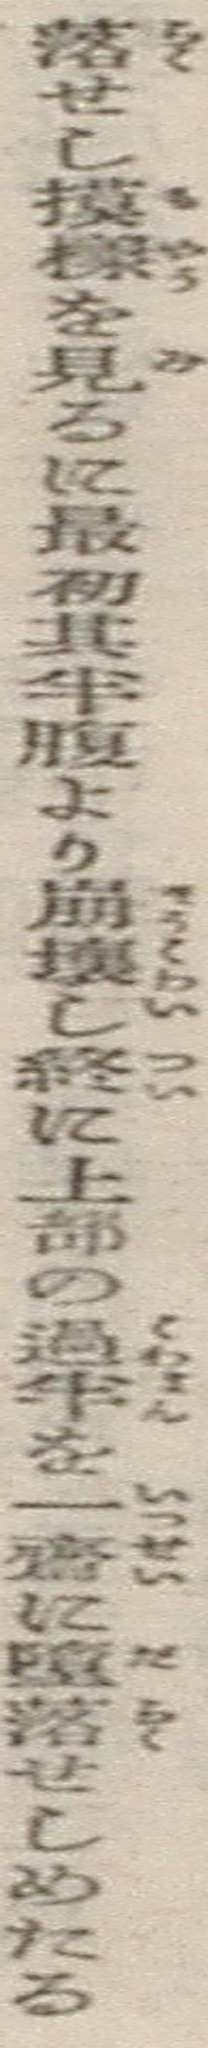落せし摸様を見るに最初其半腹より崩壊し終に上部の過半を一齊に堕落せしめたる
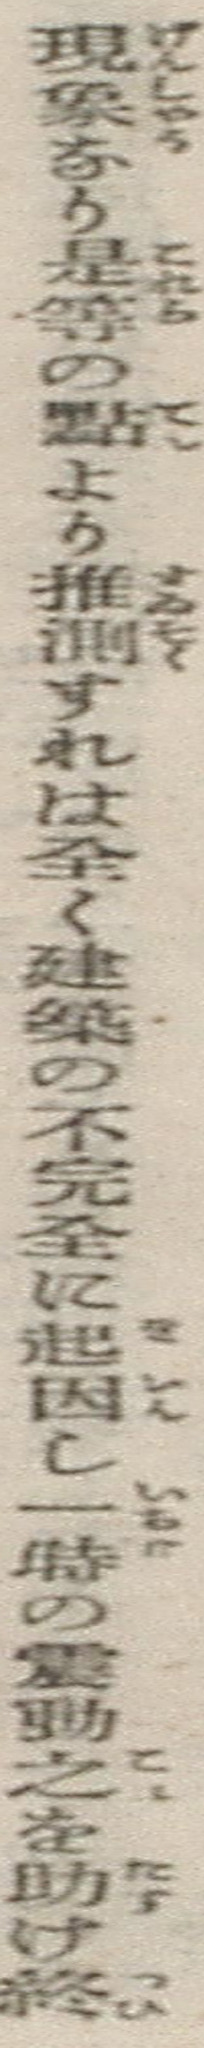現象なり是等の點より推測すれは全く建築の不完全に起因し一時の震動之を助け終
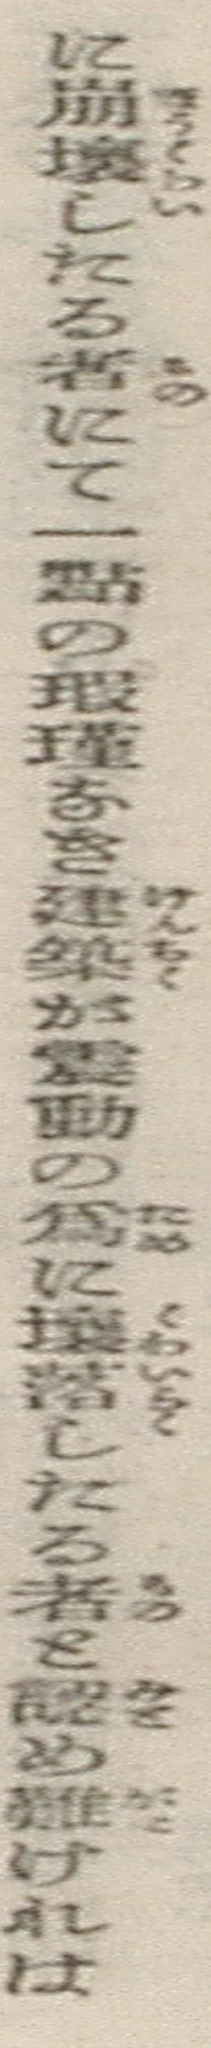に崩壤したる者にて一點の瑕瑾なき建築が振動の為に壤落したる者と認め難けれは
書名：愛知岐阜福井三県　大地震見聞録（内題）
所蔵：東京大学地震研究所図書室 Earthquake Research Institute Library, The University of Tokyo, JAPAN
